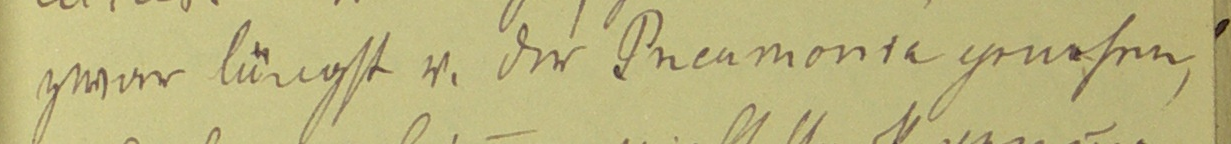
zwar längst von der Pneumonie genesen,
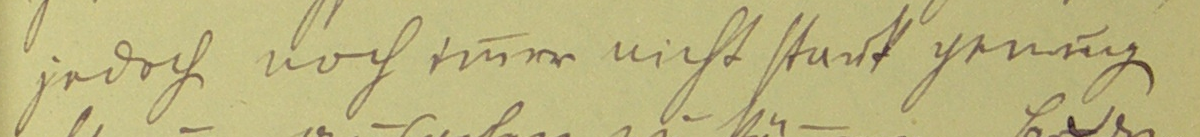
jedoch noch immer nicht stark genug
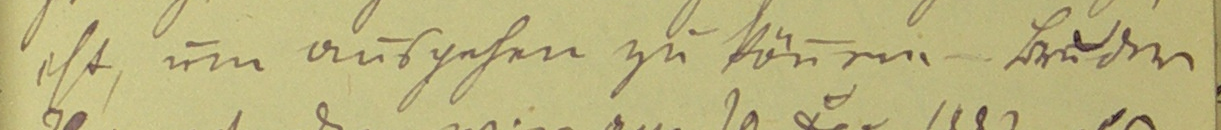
ist, um ausgehen zu können.- Bruder
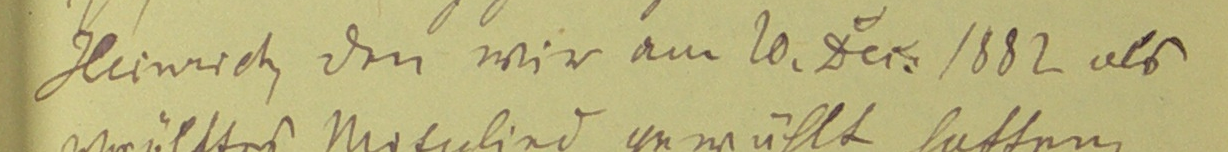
Heinrich den wir am 20.Dez. 1882 als
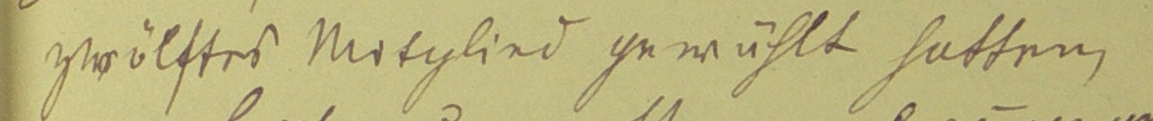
zwölftes Mitglied gewählt hatten,
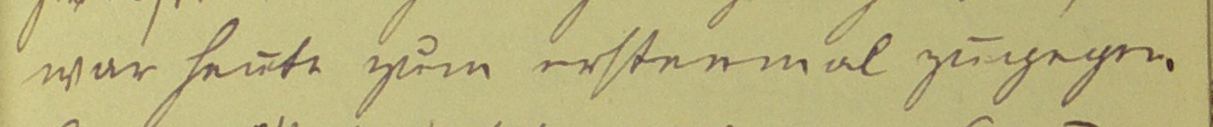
war heute zum erstenmal zugegen.
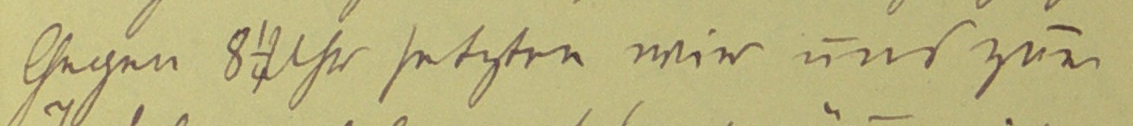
Gegen 8 1/4 Uhr setzten wir uns zur
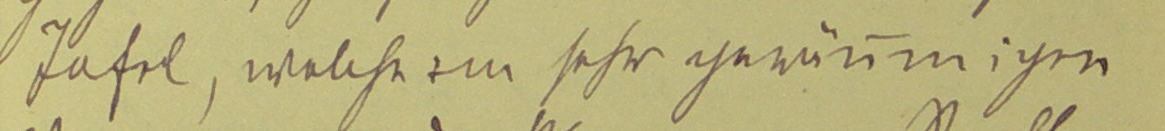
Tafel, welche im sehr geräumigen
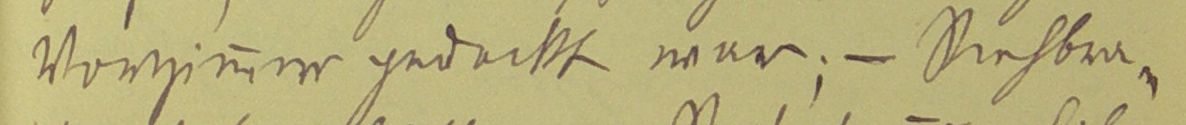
Vorzimmer gedeckt war; - Rehbra¬
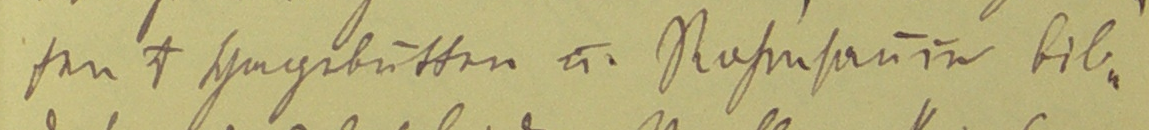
ten mit Hagebutten und Rahmsauce bil¬
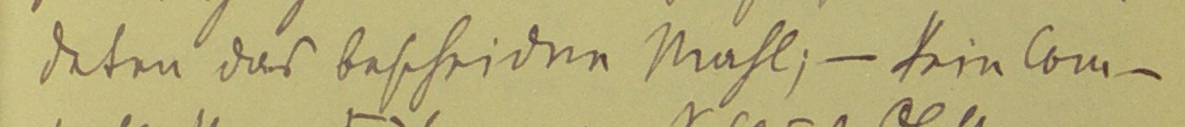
deten das bescheidene Mahl; - kein Com¬
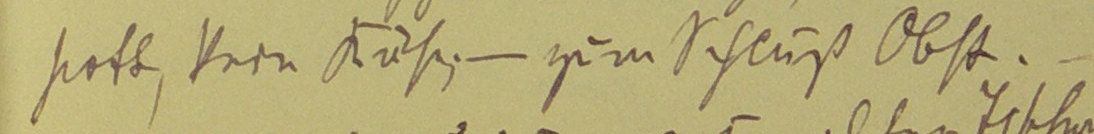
pott, kein Käse, - zum Schluss Obst,
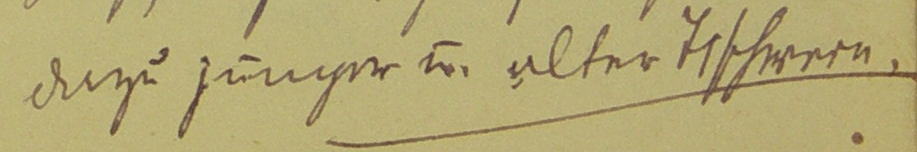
dazu junger und alter Tischwein.
